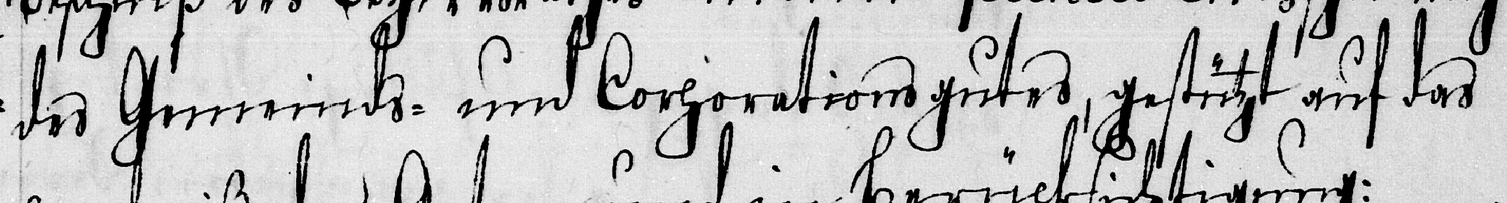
des Gemeinds- und Corporationsgutes, gestützt auf das
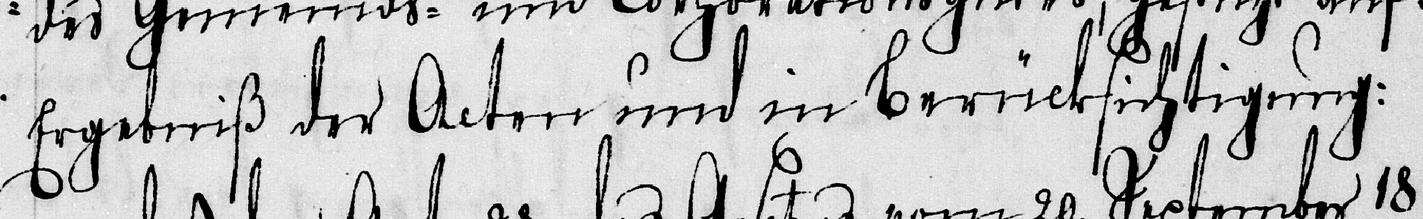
Ergebniβ der Acten und in Berücksichtigung:
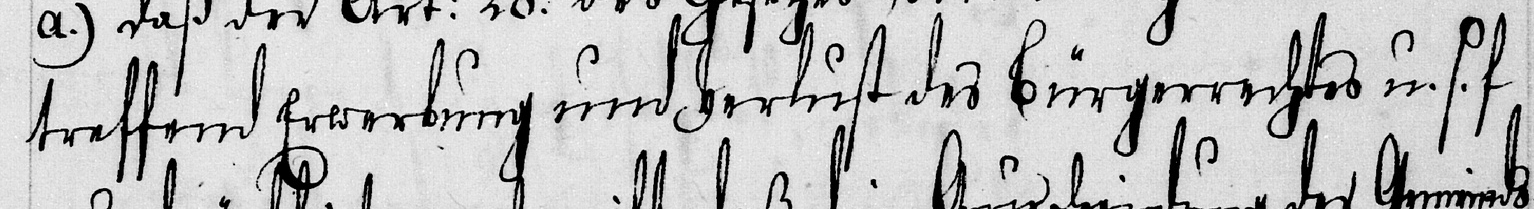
treffend Erwerbung und Verlust des Bürgerrechts u. s.
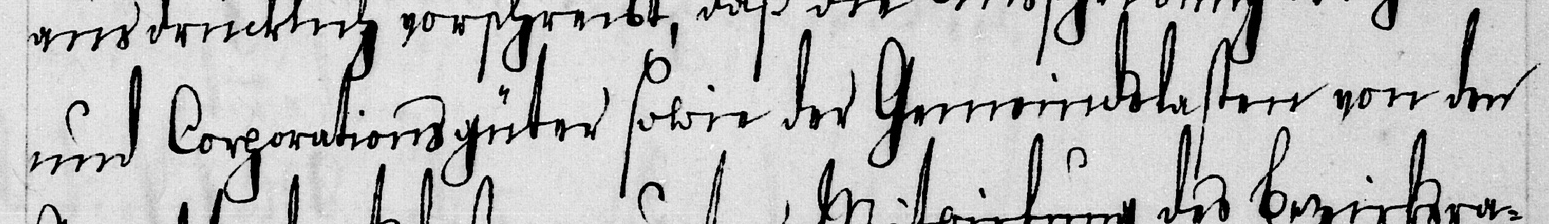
und Corporationsgüter sowie der Gemeindslasten von den
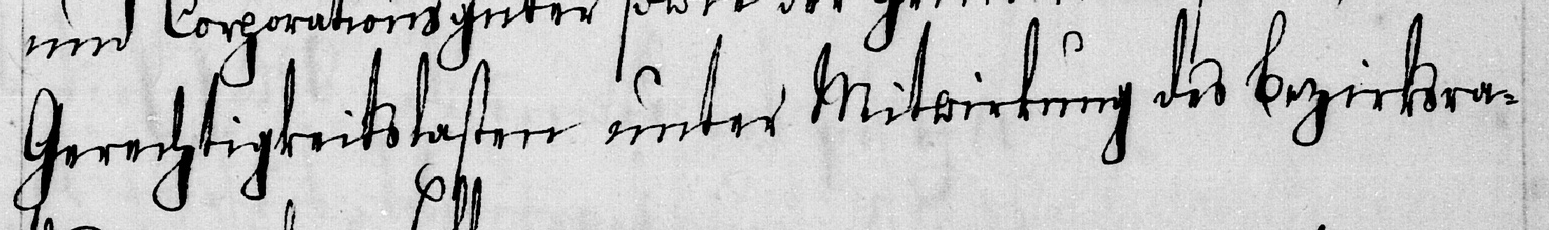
Gerechtigkeitslasten unter Mitwirkung des Bezirksra¬
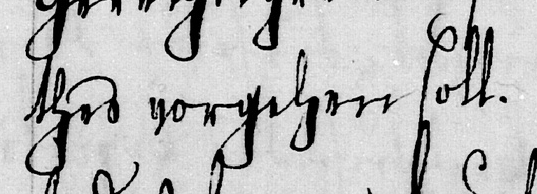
thes vorgehen soll.
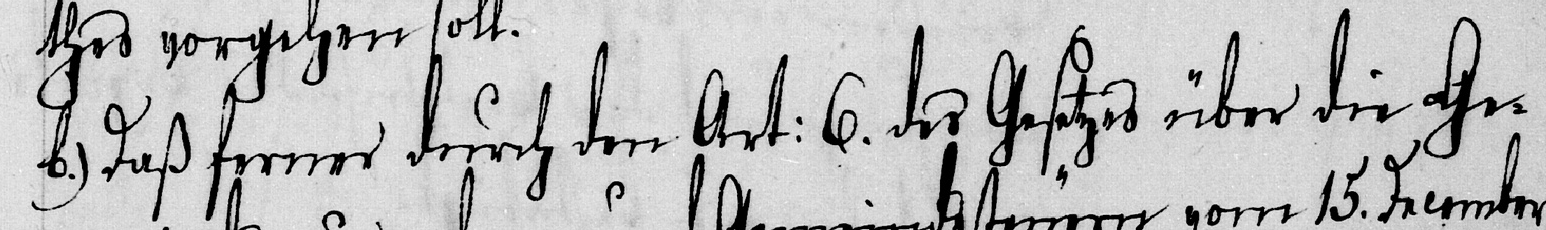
Daß ferner durch den Art: 6. des Gesetzes über die Ge¬
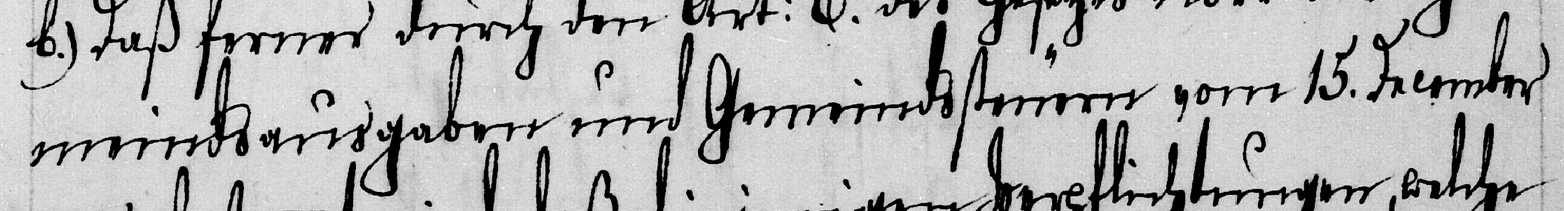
meindsausgaben und Gemeindssteuern vom 15. December
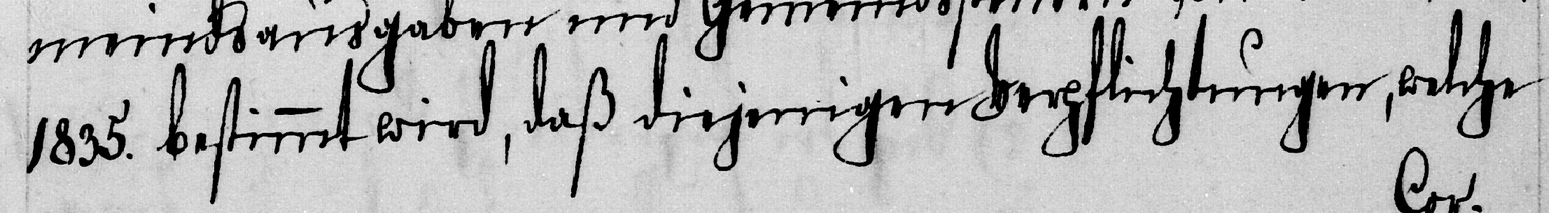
1835. bestimmt wird, daß diejenigen Verpflichtungen, welche
